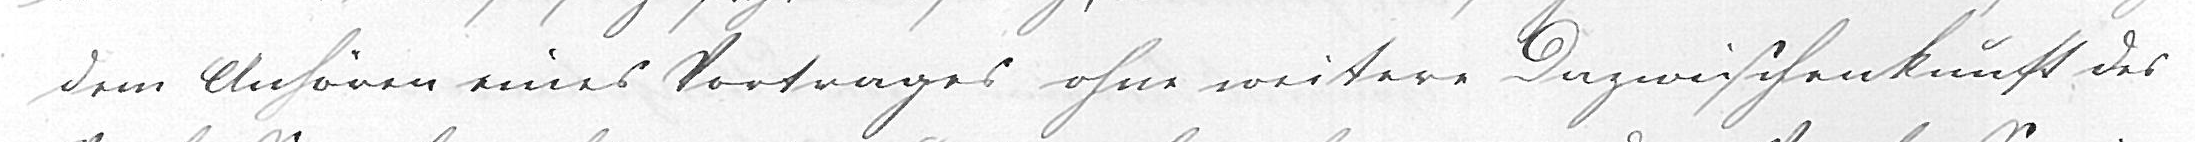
dem Anhören eines Vortrages ohne weitere Dazwischenkunft des
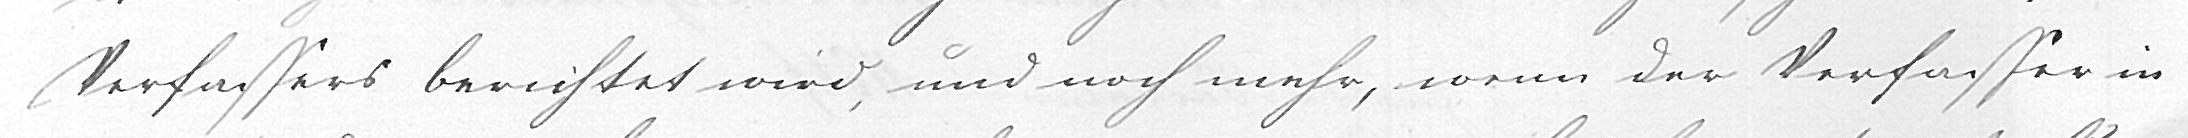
Verfassers berichtet wird, und noch mehr, wenn der Verfasser in
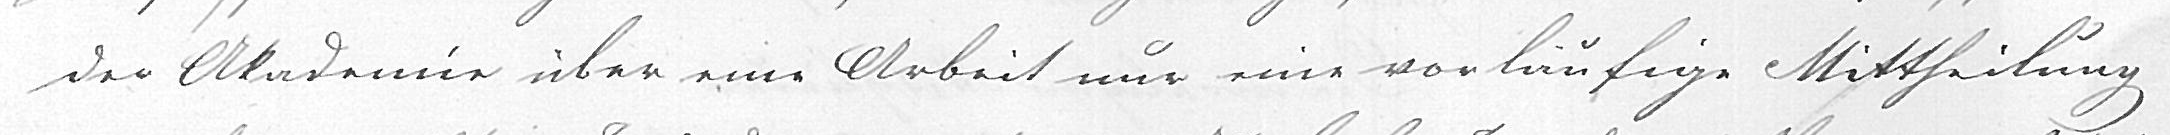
der Akademie über eine Arbeit nur eine vorläufige Mittheilung
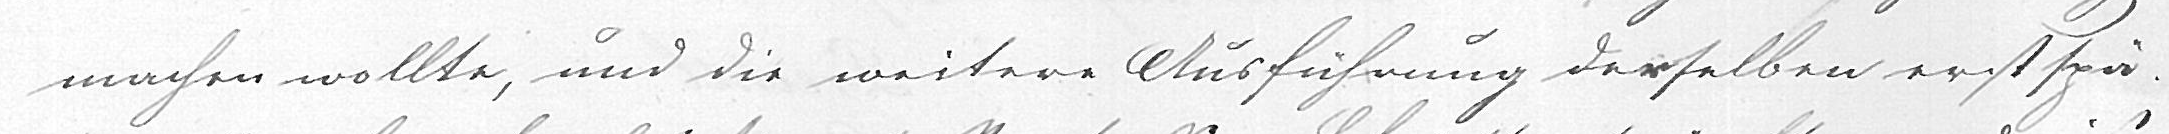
machen wollte, und die weitere Ausführung derselben erst spä-
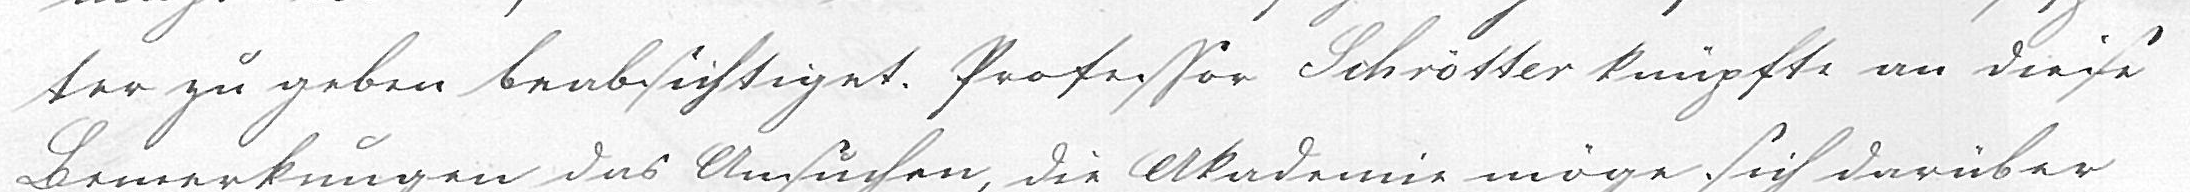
ter zu geben beabsichtiget. Professor Schrötter knüpfte an diese
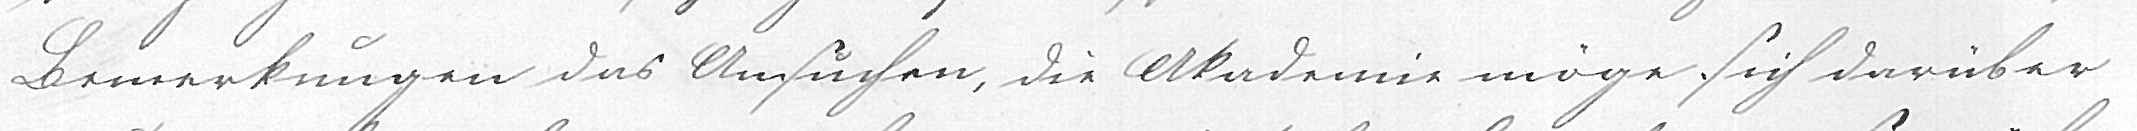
Bemerkungen das Ansuchen, die Akademie möge sich darüber
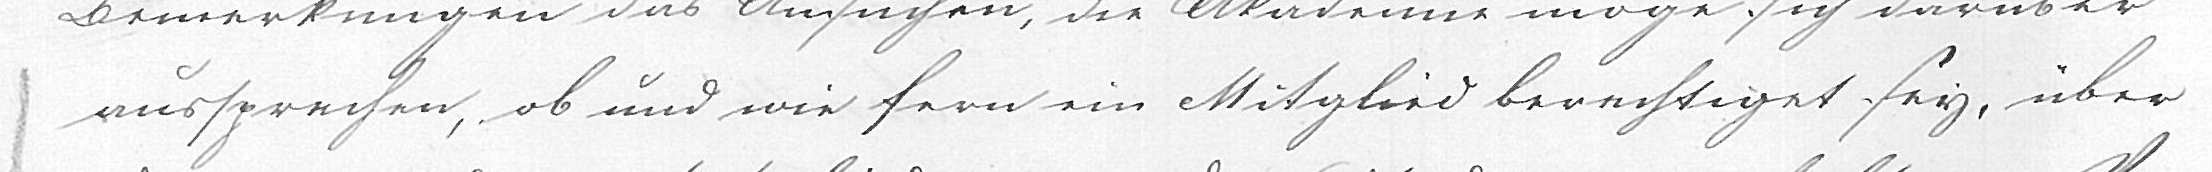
aussprechen, ob und wie fern ein Mitglied berechtiget sey, über
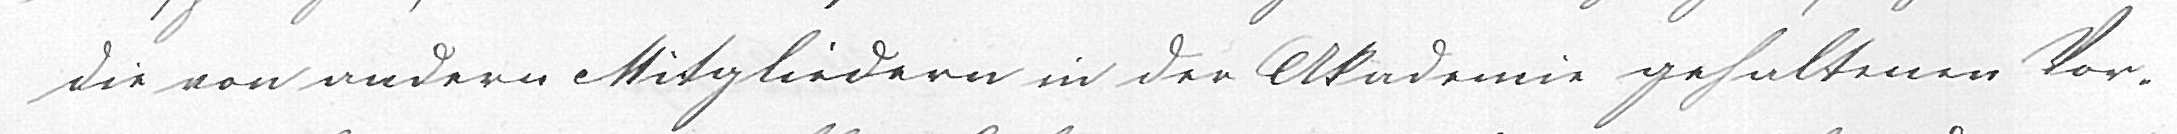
die von andern Mitgliedern in der Akademie gehaltenen Vor-
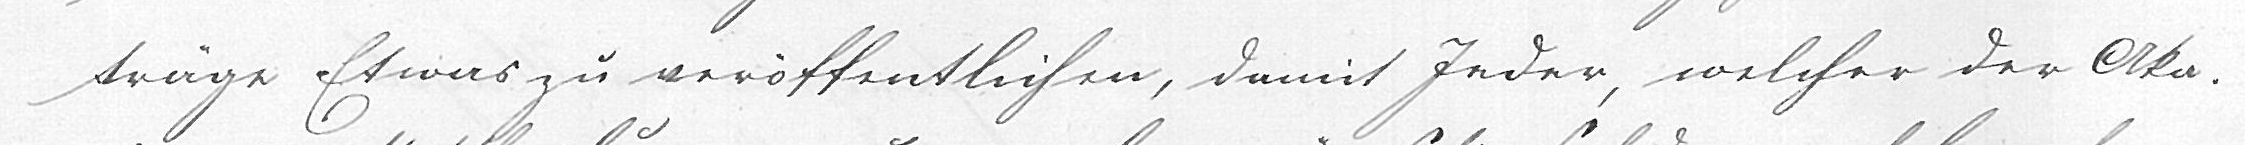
träge Etwas zu veröffentlichen, damit Jeder, welcher der Aka-
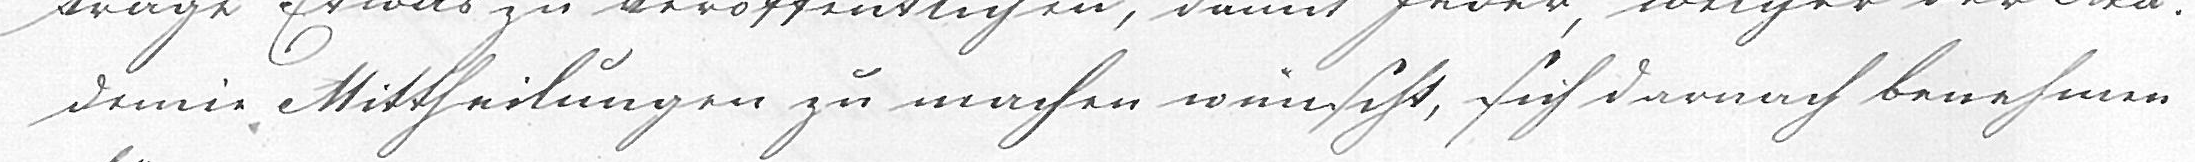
demie Mittheilungen zu machen wünscht, sich darnach benehmen
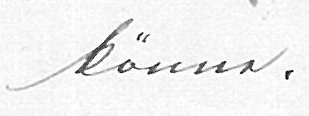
könne.
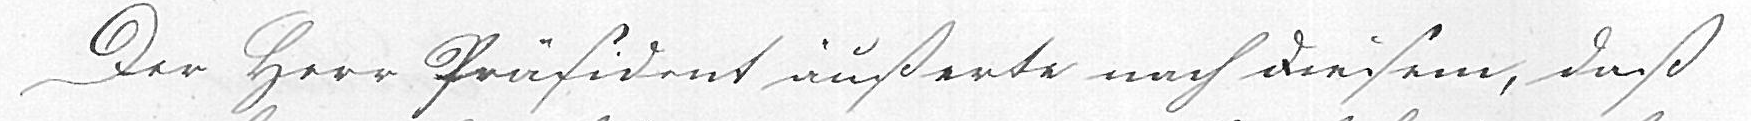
Der Herr Präsident äußerte nach diesem, daß
